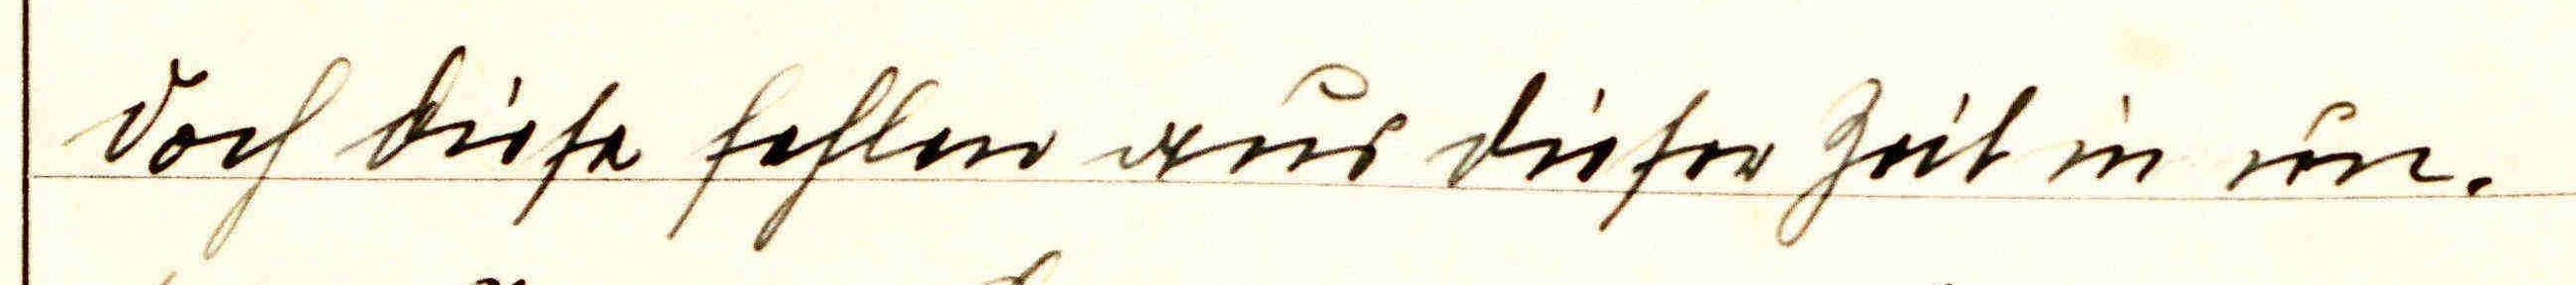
doch diese fehlen aus dieser Zeit in un-
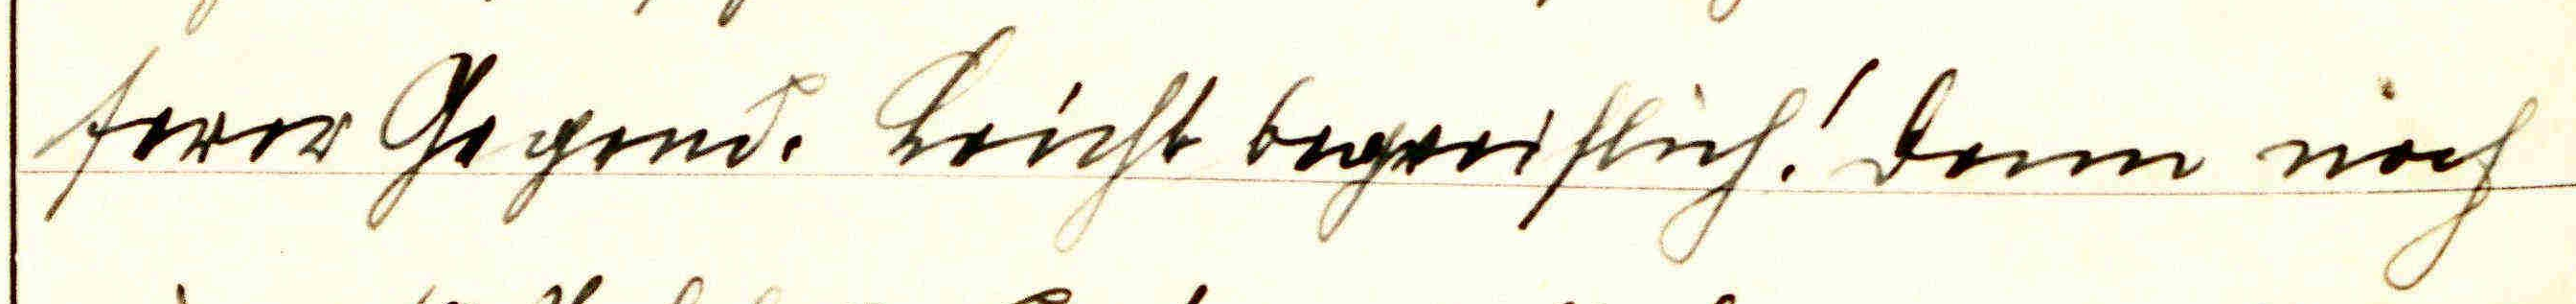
serer Gegend. Leicht begreiflich! Denn noch
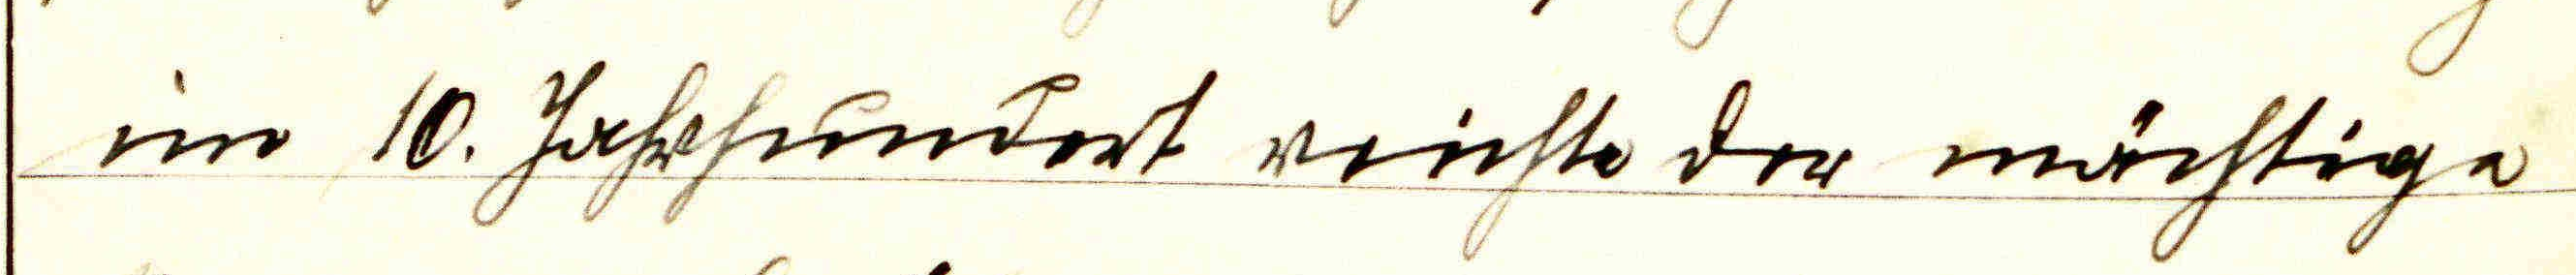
im 10. Jahrhundert reichte der mächtige
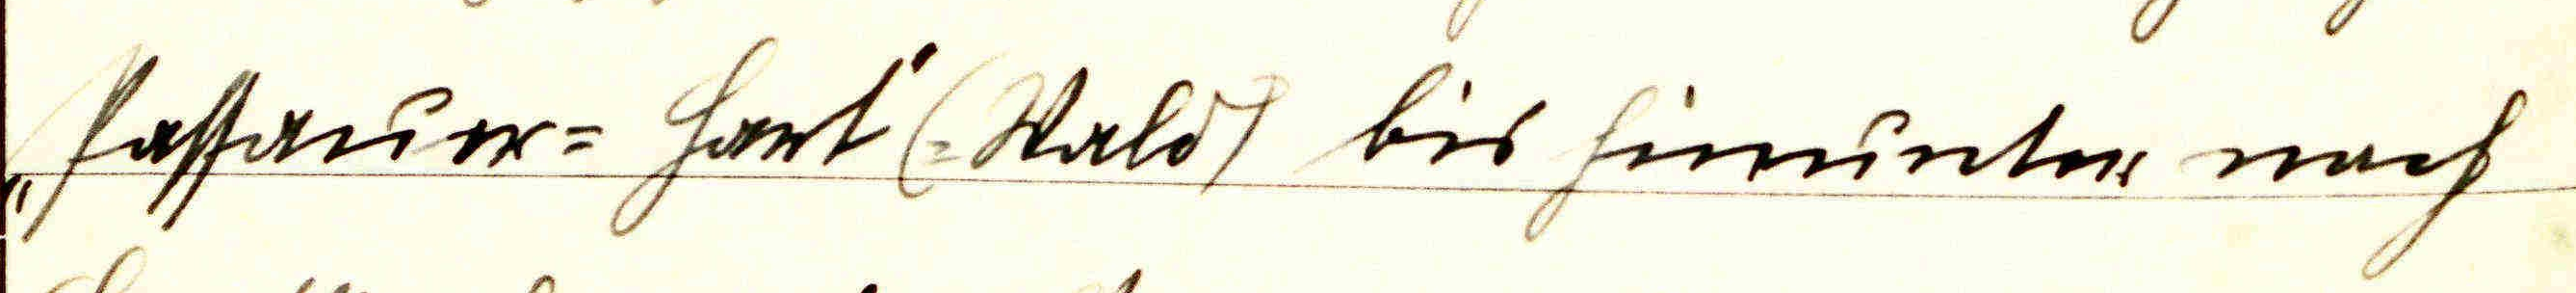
„Passauer-Hart“ (=Wald) bis hinunter nach
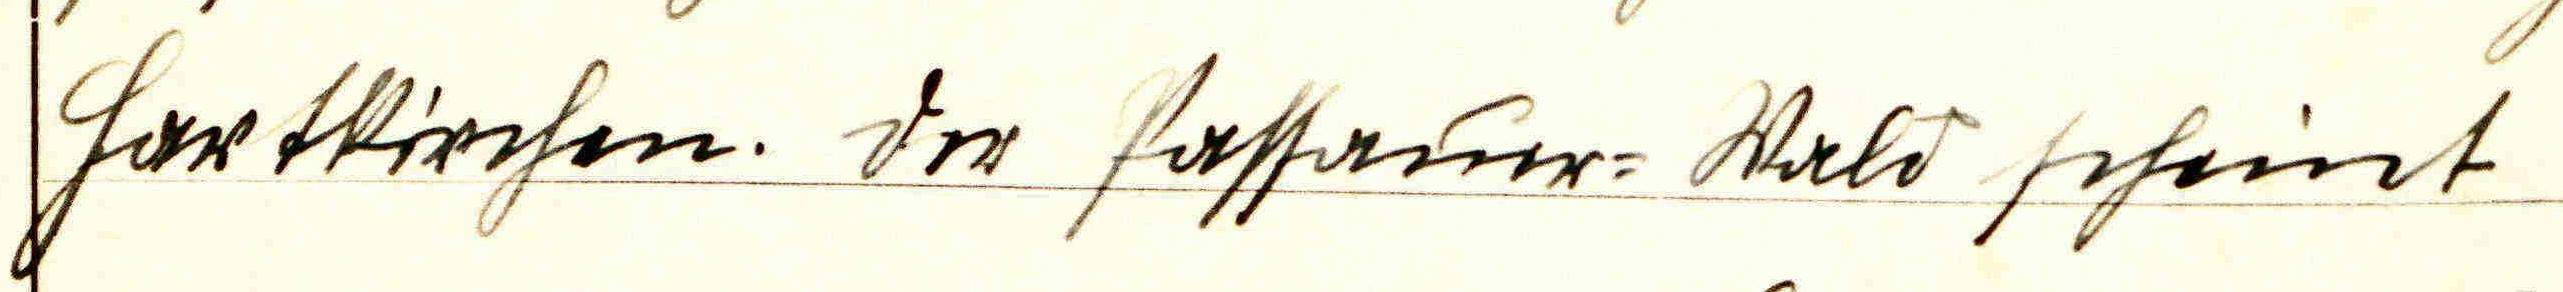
Hartkirchen. Der Passauer-Wald scheint
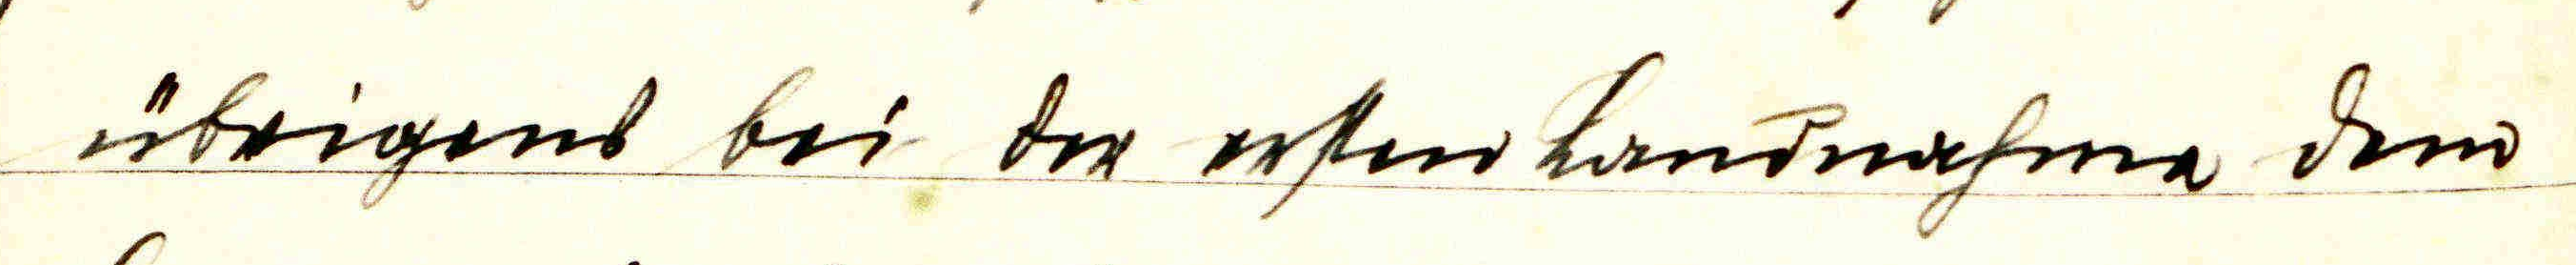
übrigens bei der ersten Landesnahme dem
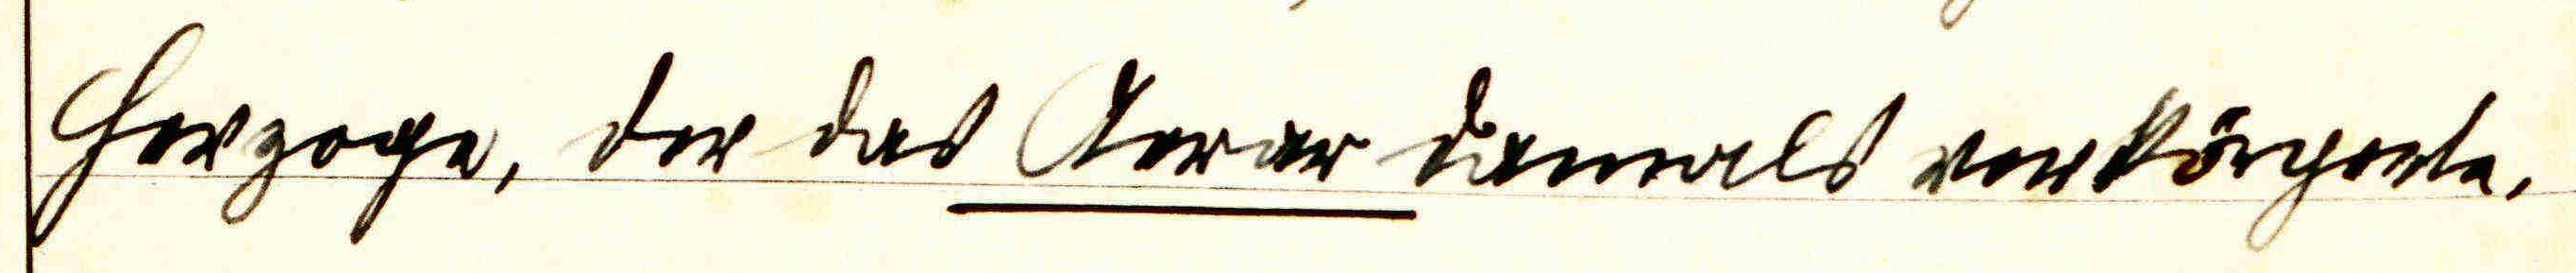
Herzoge, der das Aerar damals verkörperte,
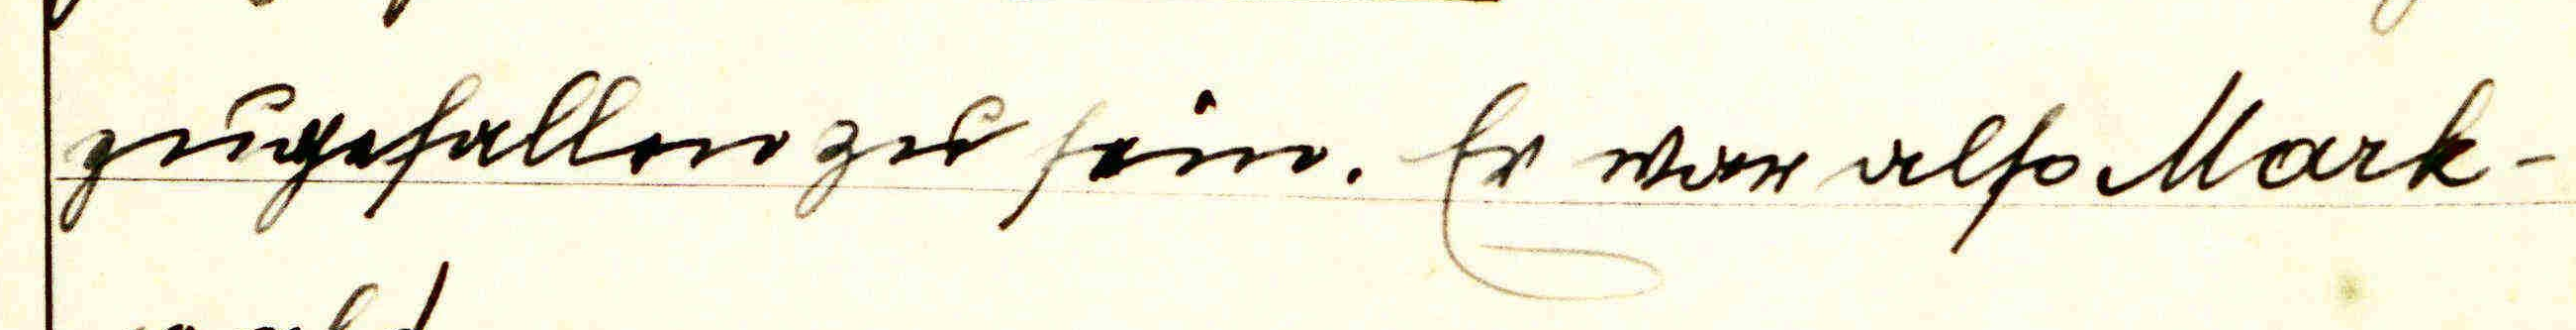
zugefallen zu sein. Er war also Mark-
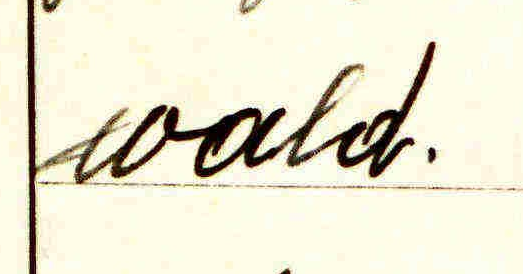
wald.
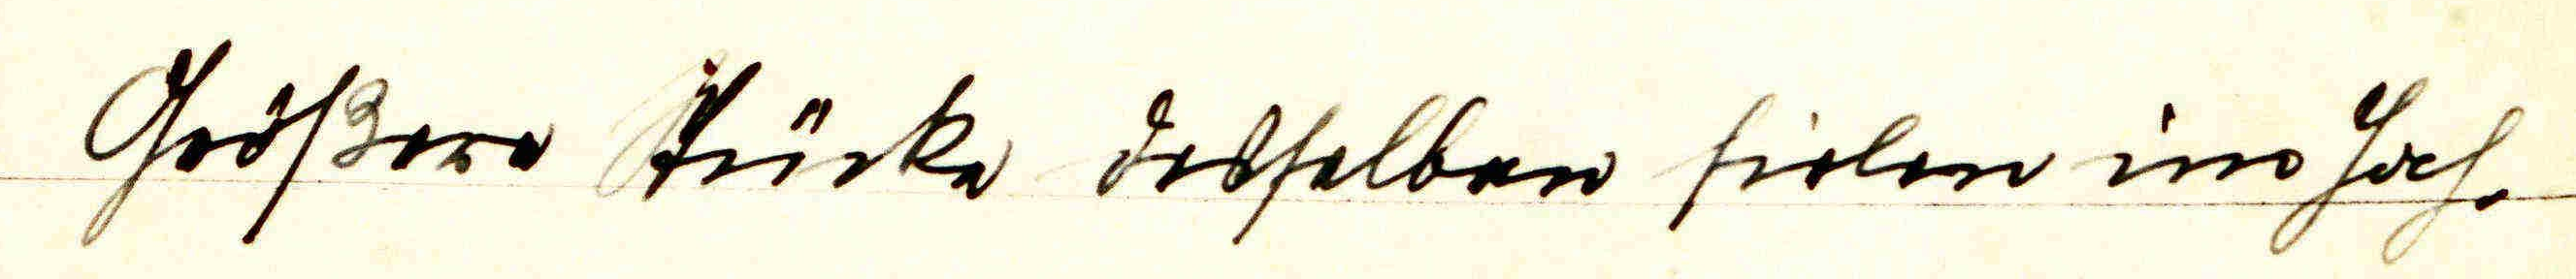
Größere Stücke desselben fielen im Jah-
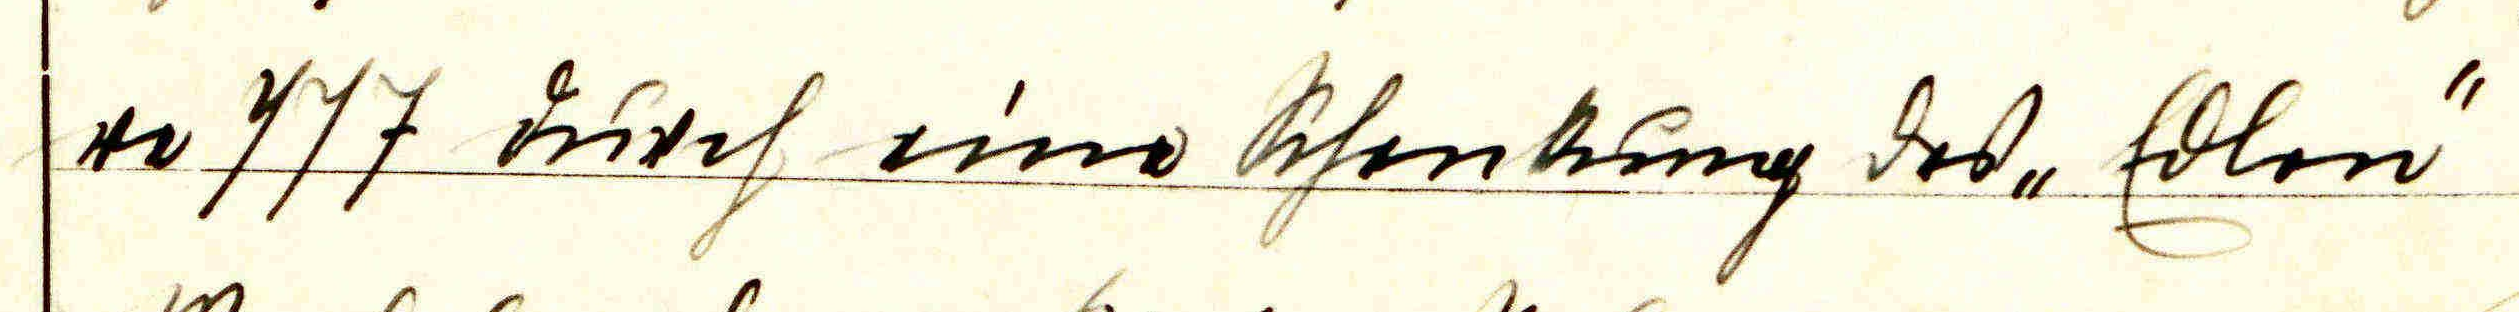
re 777 durch eine Schenkung des „Edlen“
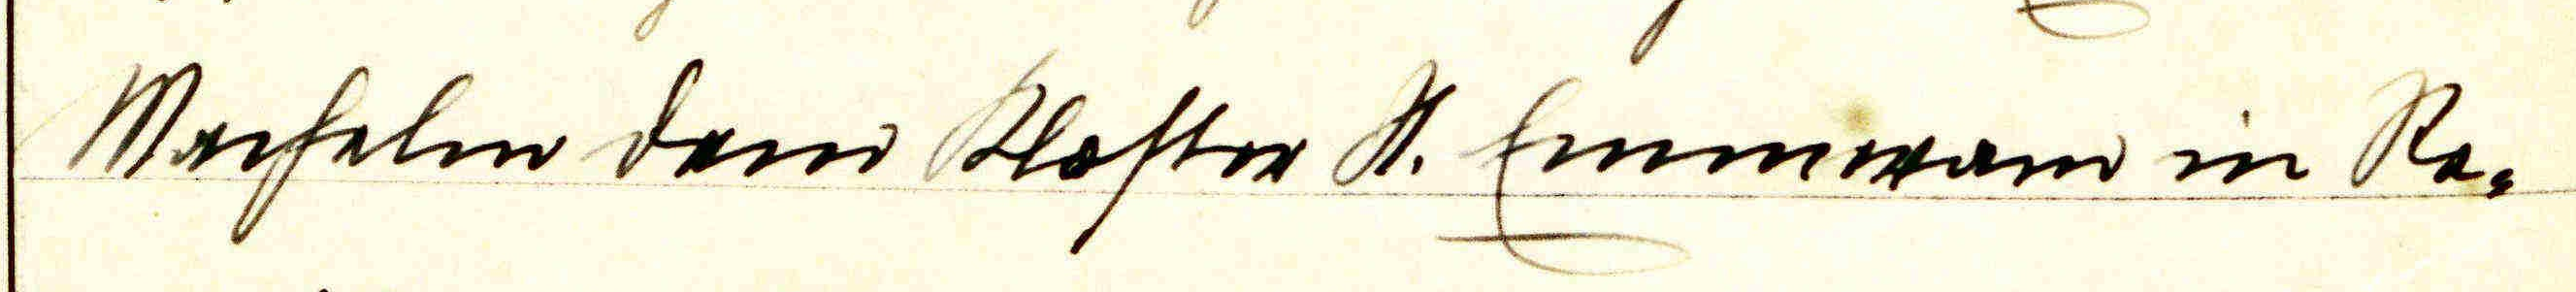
Machelm dem Kloster St. Emmeram in Re-
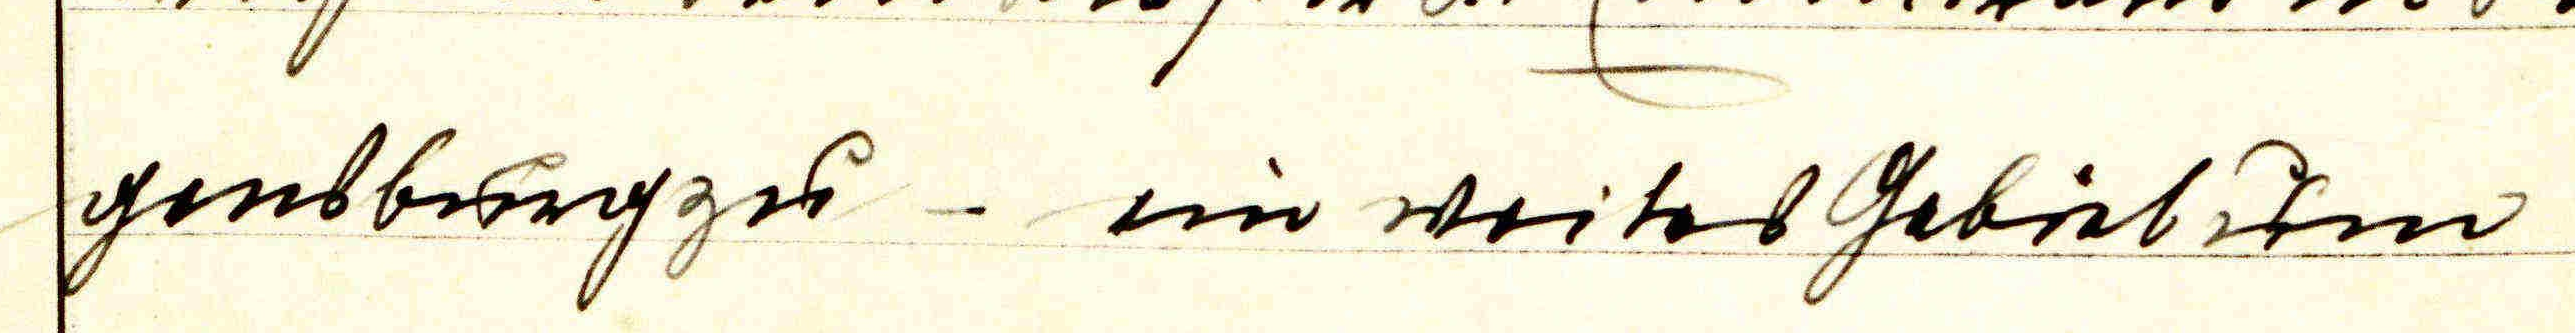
gensburg zu – ein weites Gebiet um
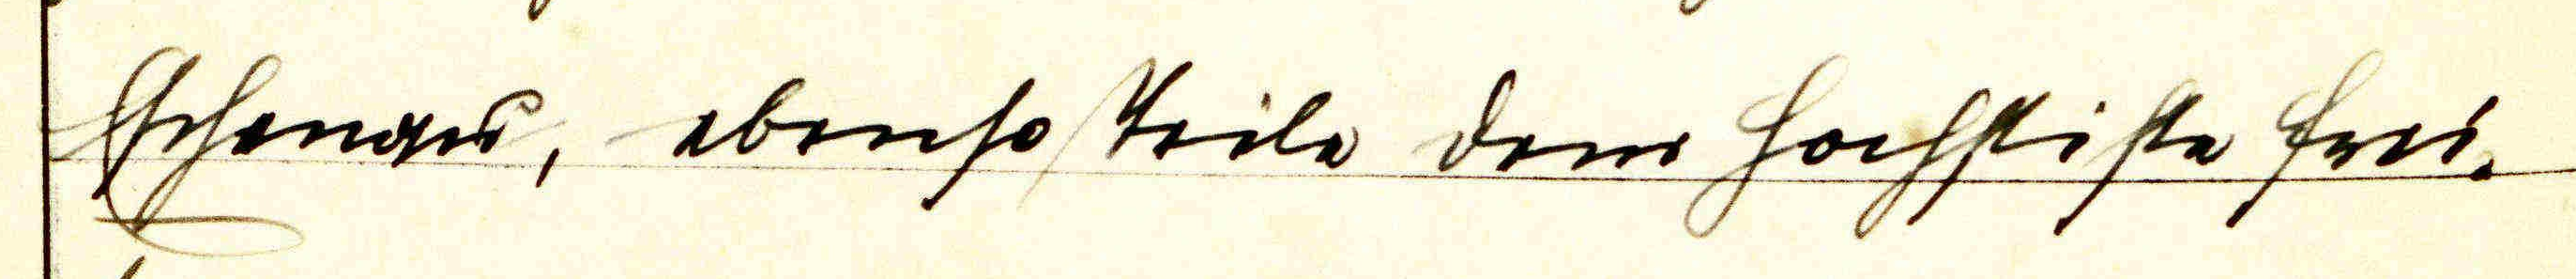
Eschenau, ebenso Teile dem Hochstifte Frei-
